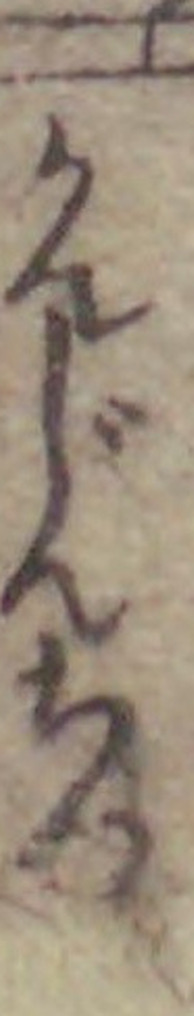かんじんちつ
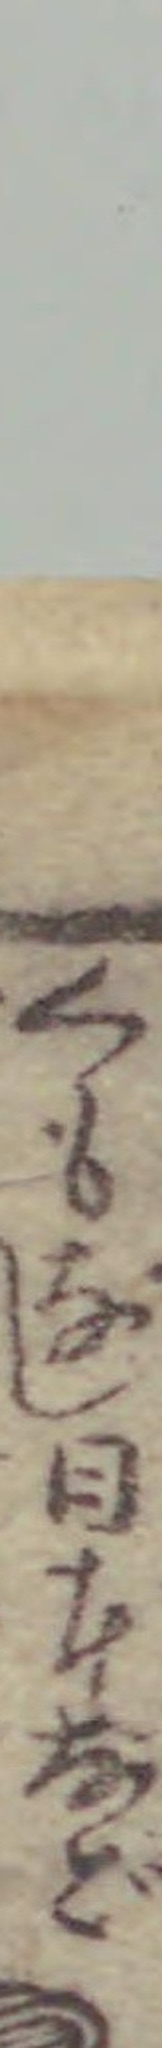くもなし日本など
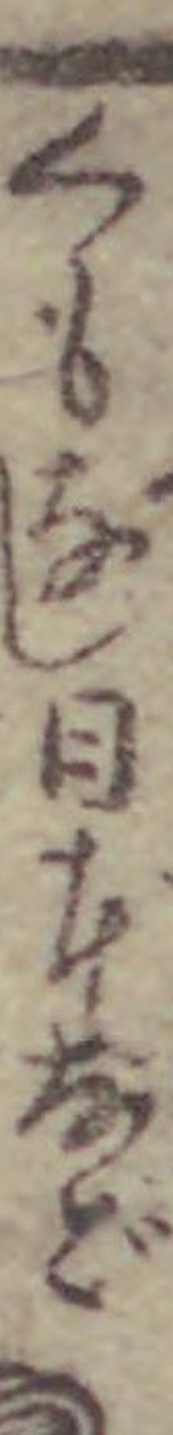くもなし日本など
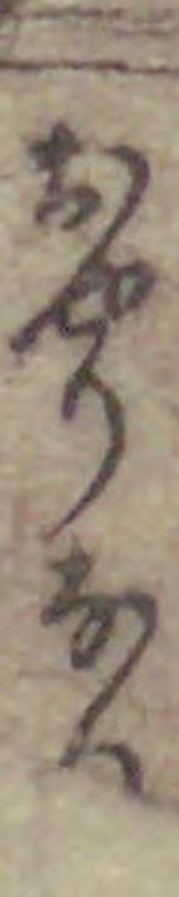おやりなん
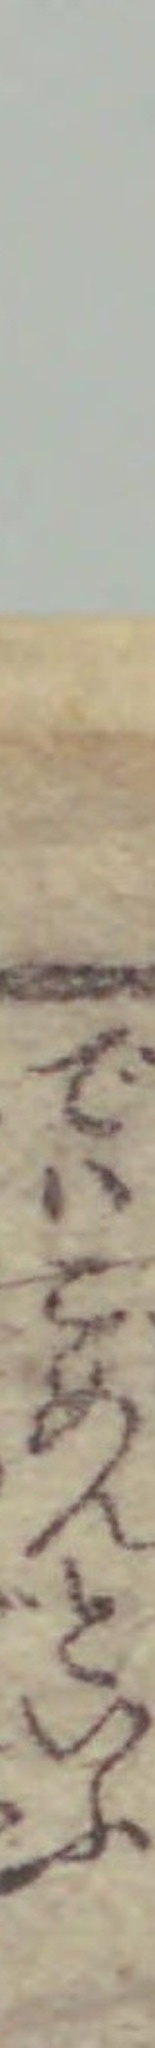ではこめんといふ
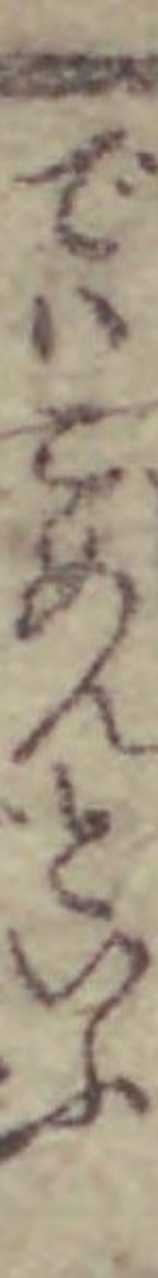ではこめんといふ
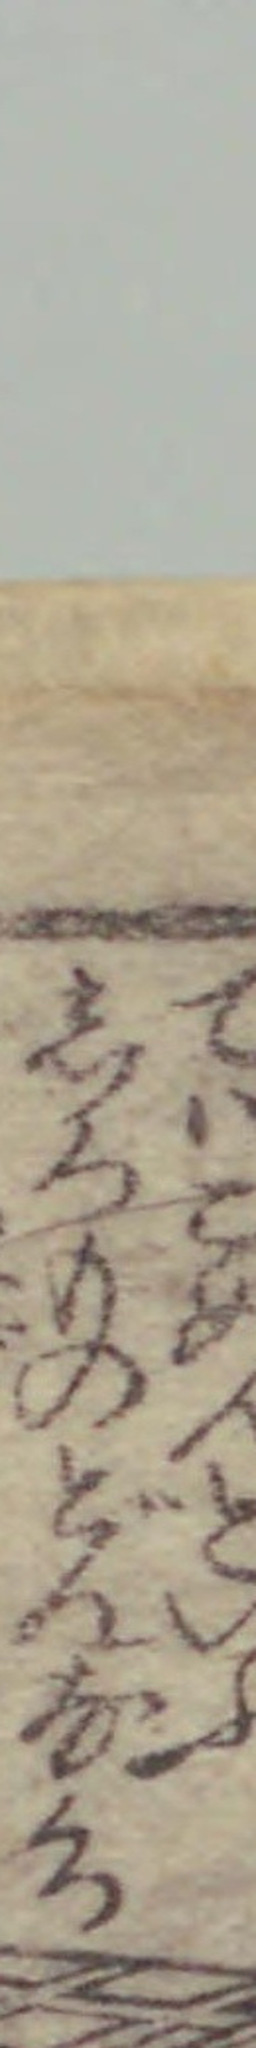しろものどんなうつ
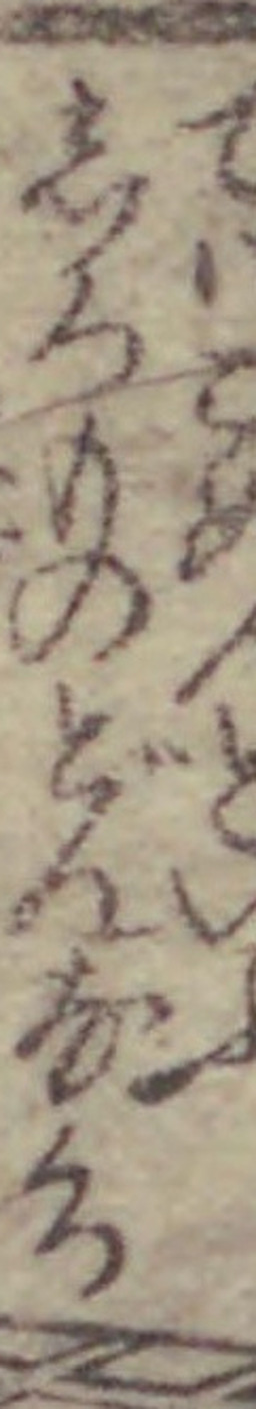しろものどんなうつ
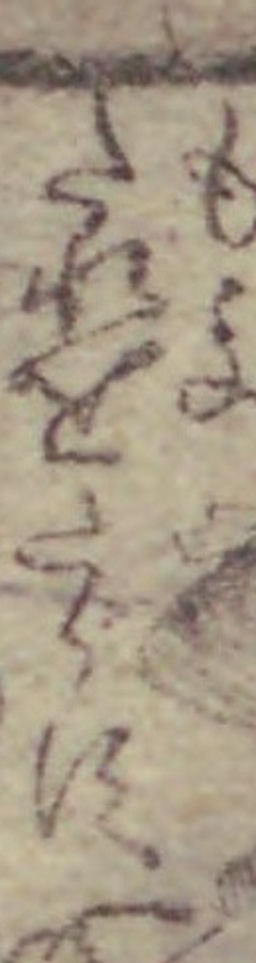たれをたらす
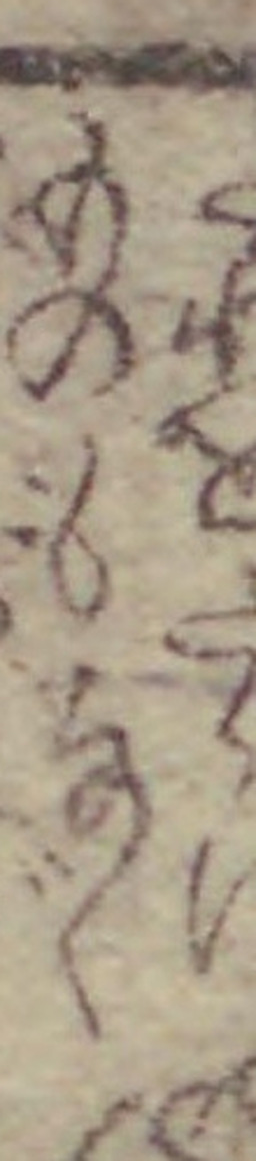ものもなく
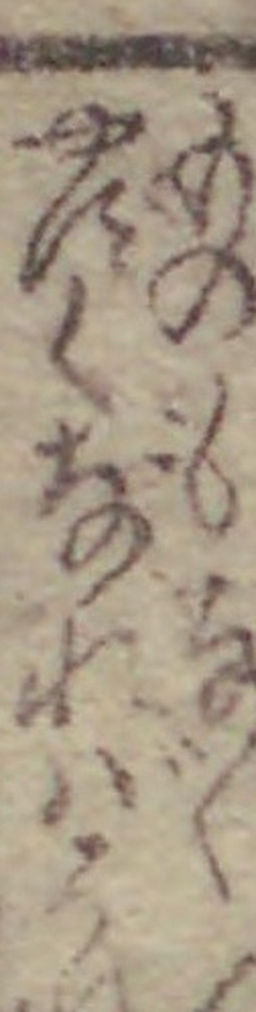やすくなればうれ

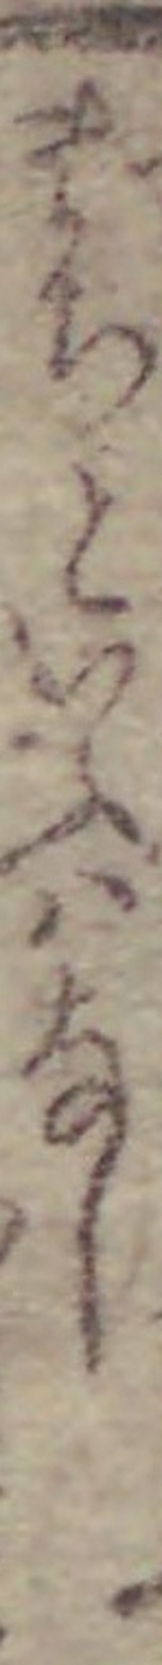まちといふはなし
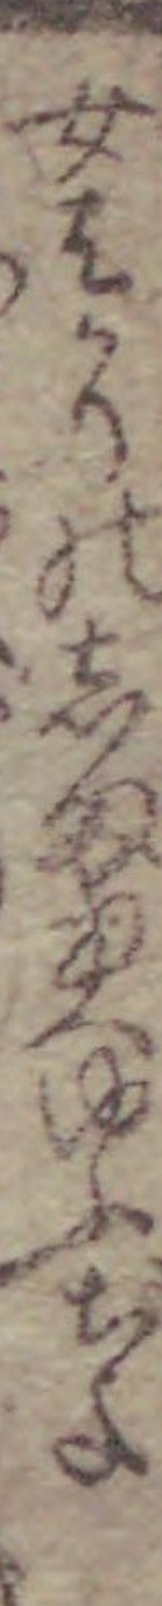女はかりのしまゆへゆふちよ
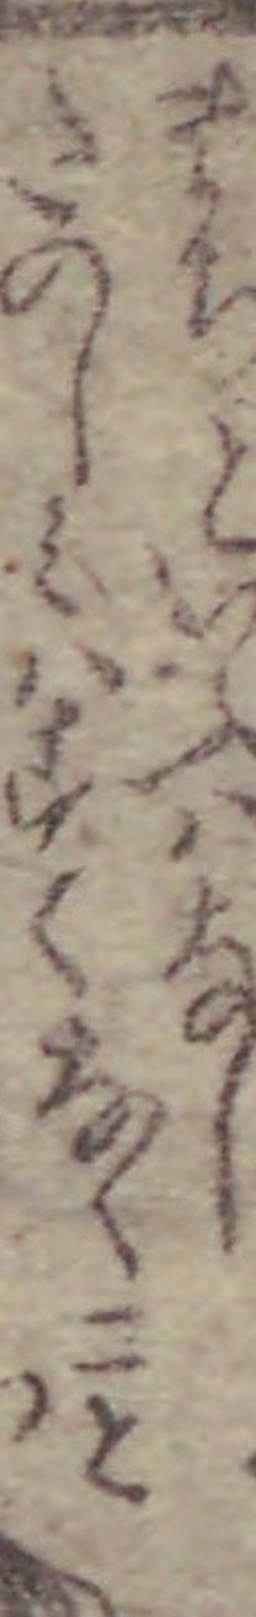たのしみはすくなくこと
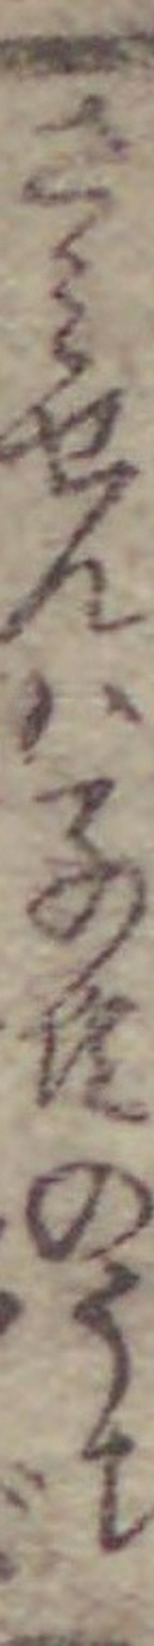さみせんは子共のうち
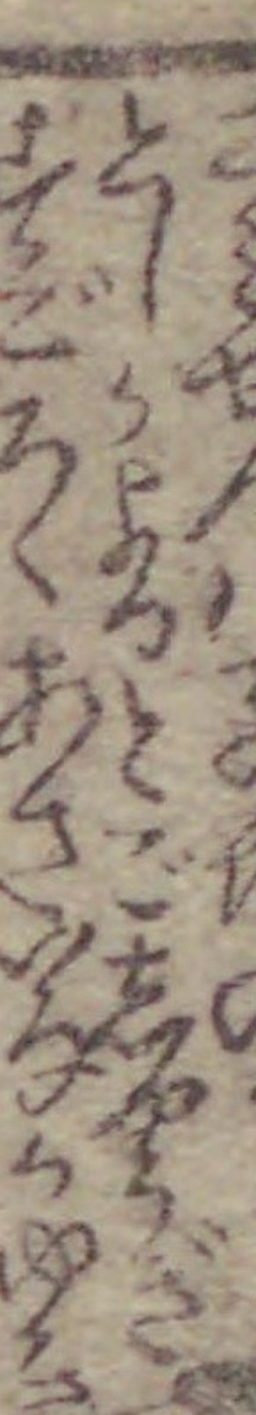すごろくあさいなかゆき
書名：近頃嶋めぐり 3巻
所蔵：国立国会図書館 National Diet Library, JAPAN
